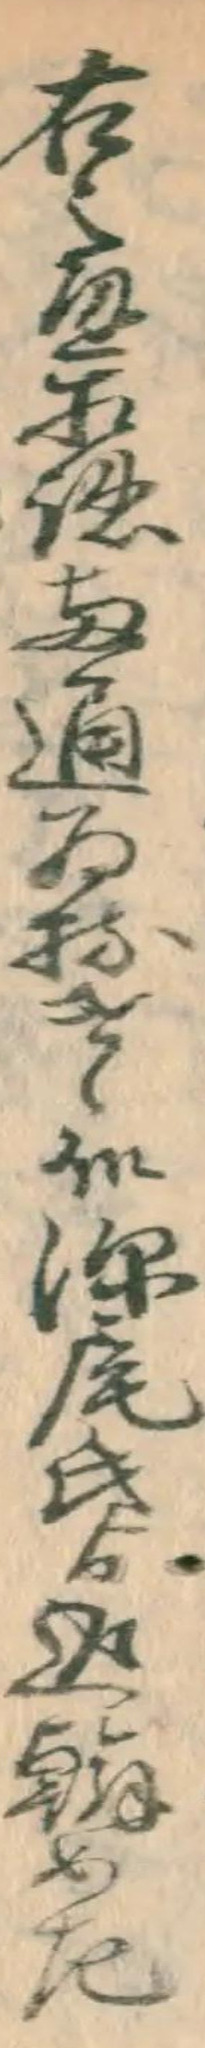右之通相認両通為持遣候処深尾氏ゟ返瀚如左
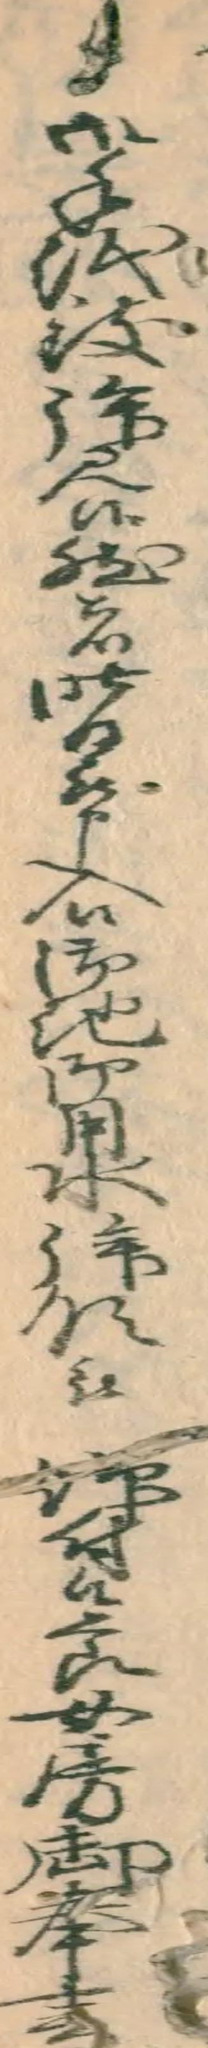御手紙致拝見候然者昨日被申入候御池御用水拝領被仰付候節女房御奉書
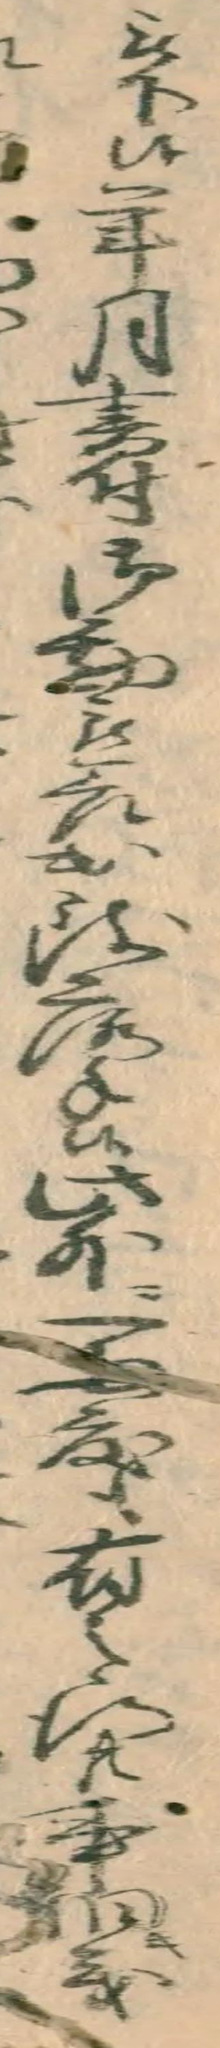被下候年月書付御勘被差出致落手候此外ニ一両度も有之候得共事旧キ義
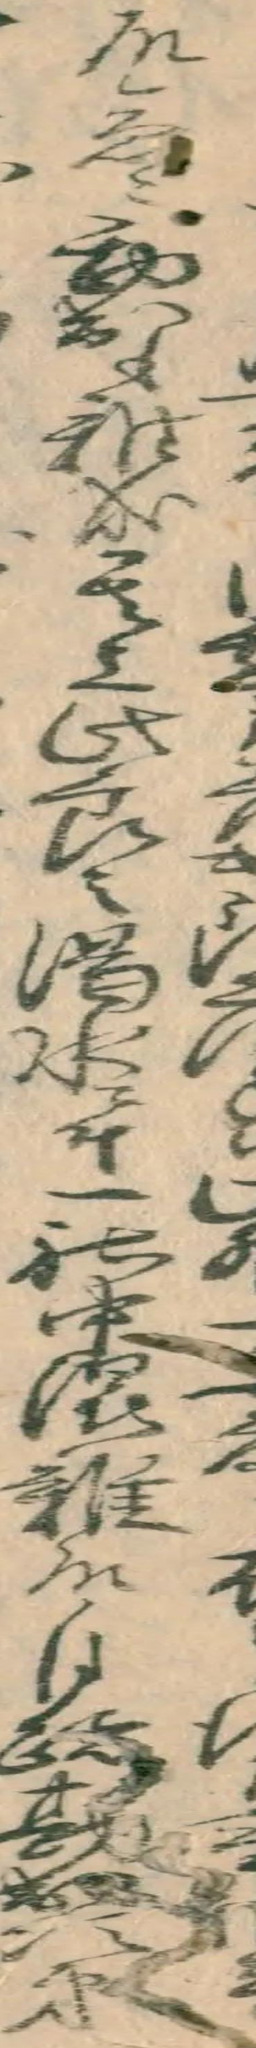故急々勘出も難成其上此節之渇水ニ付一社中混雑故自跡勘出次第
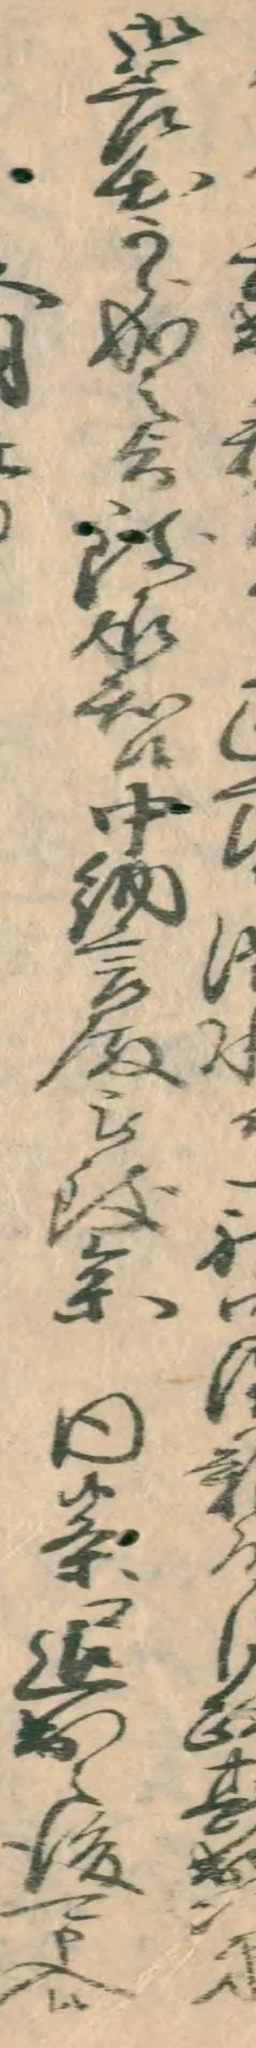御差出可被成之旨致承知候中納言殿被致参内候条退出之後可申入候以上
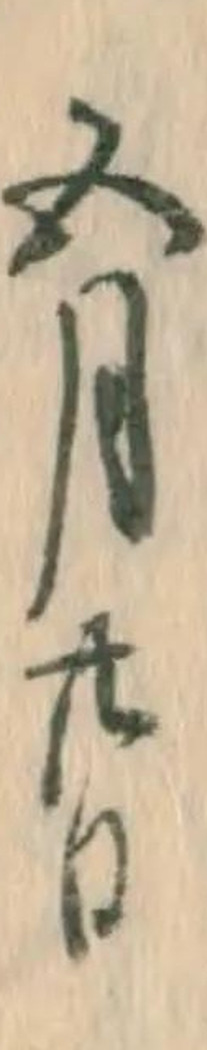五月廿日
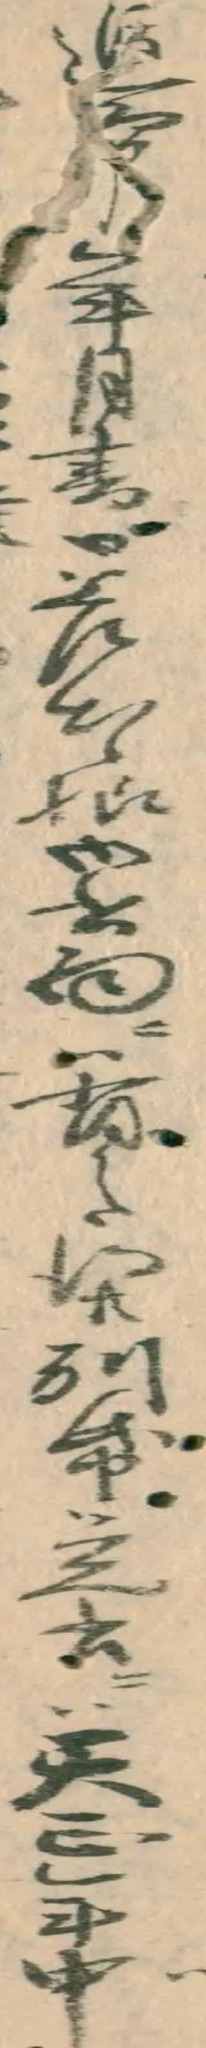追而申上年月書御差出候様御書面ニハ有之候得共別紙覚書ニハ天正年中
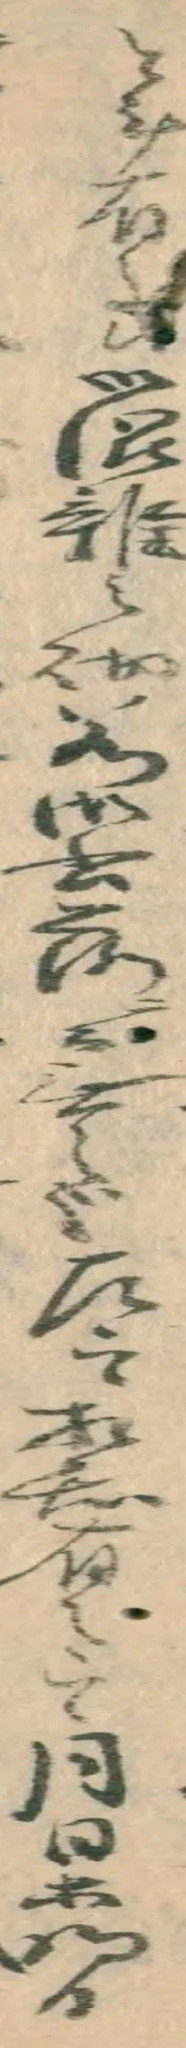と計有之候御混雑之砌若御書落ニ而無之哉左候ハヽ相知有之候ハヽ月日等明日
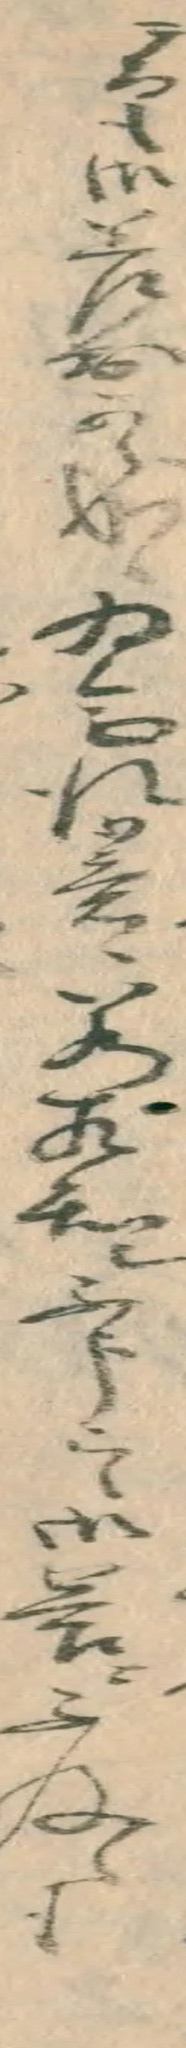ニ而も御差出可被成候為念得御意候若相知レ不申候ハヽ御答ニ不及候以上
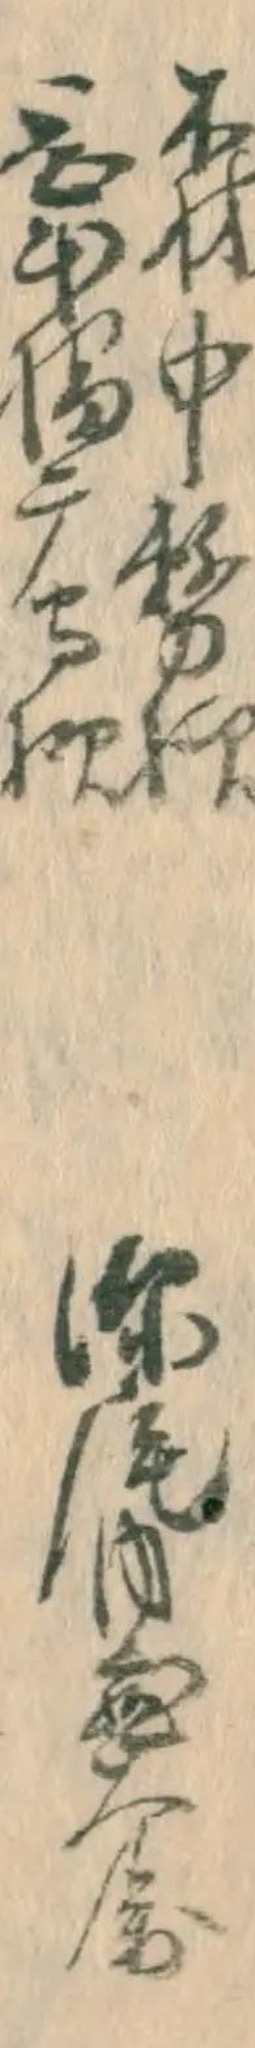岡本播磨守様深尾内蔵大属
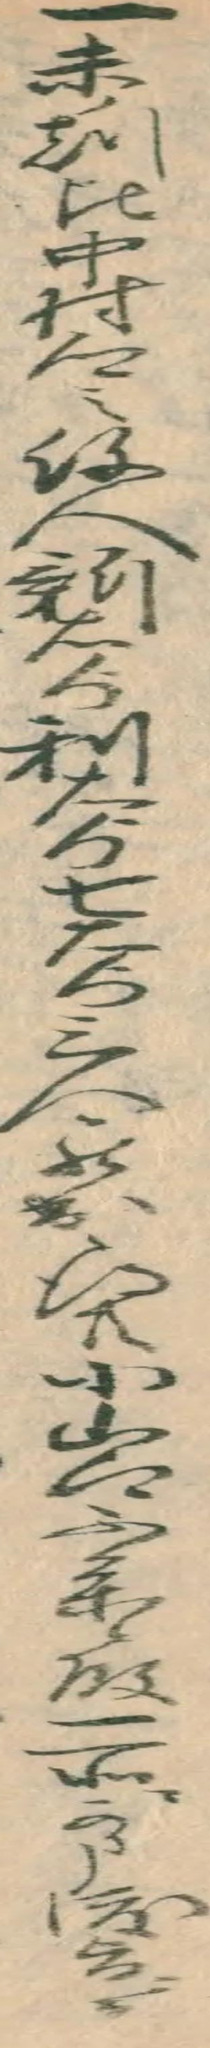一未ノ刻頃中村郷之役人新右衛門利右衛門七右衛門三人罷出候得共小山郷不参候故一所ニ可申渡旨ニ而
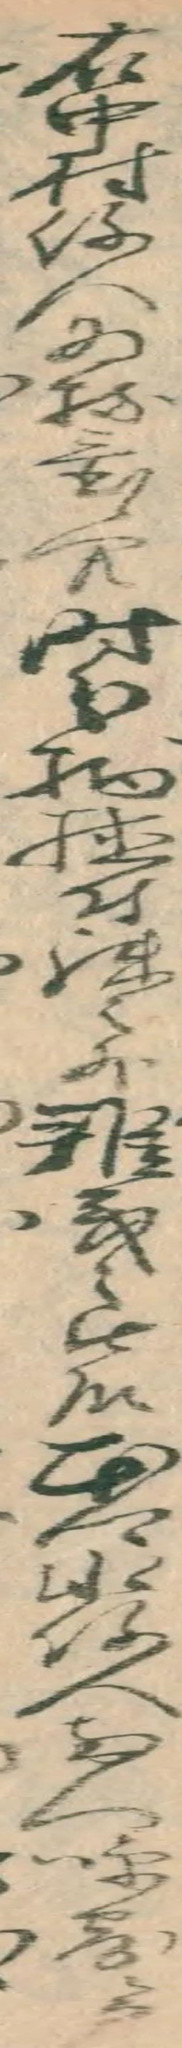右中村役人為持置候へ共時分柄植付殊之外難義之由故本郷水役人両人呼寄候而
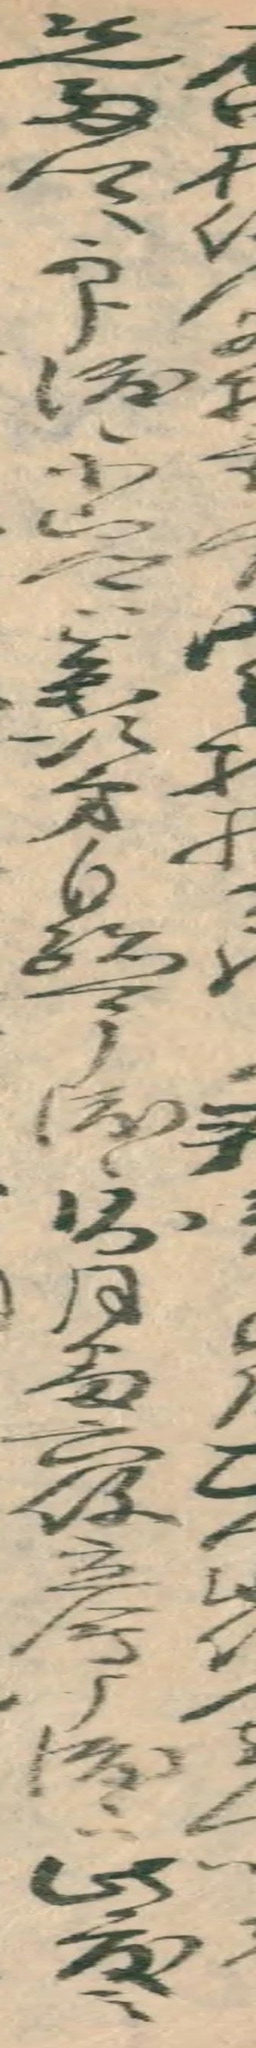先両郷へ可申渡候小山郷ハ参次第自跡申渡候則月番六役立会申渡候ハ此度之
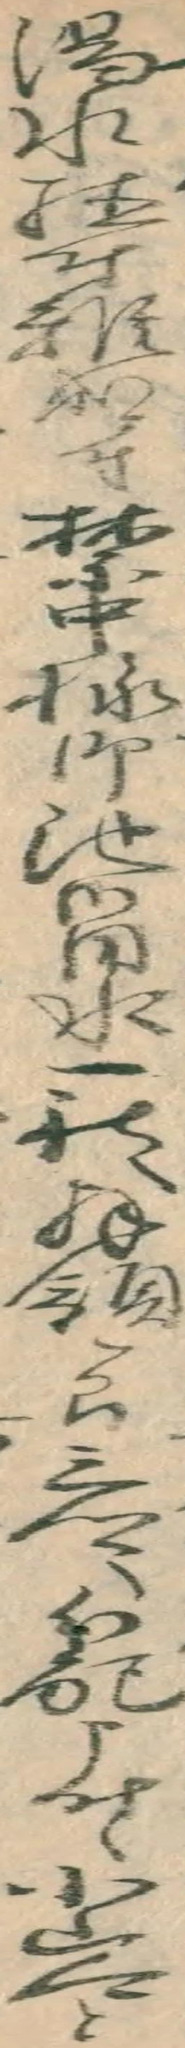渇水植付難義ニ付禁中様御池御用水一社へ拝領候間三郷へ分配申付候小山郷と
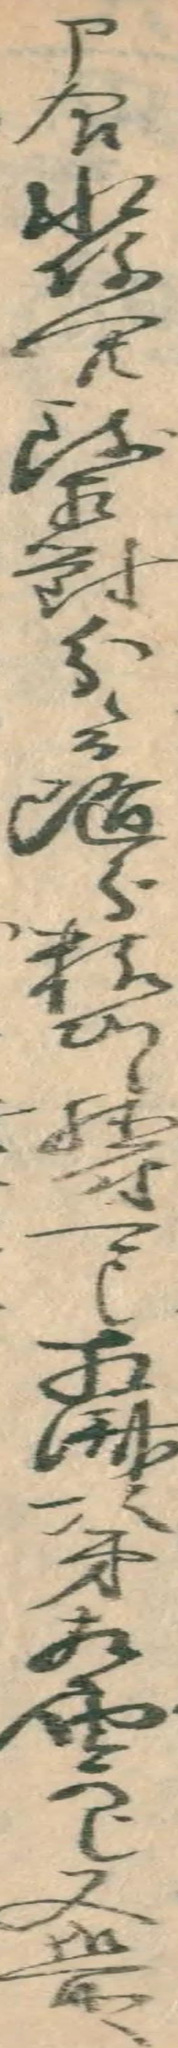申合水役人共致相対分候而随分精出し植付可申候相済次第相届可申候又御所へ
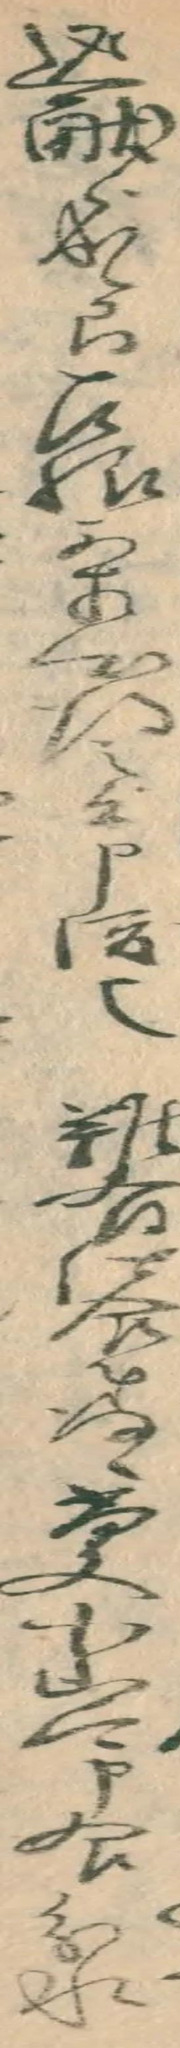返献被成候間左様可相心得之旨申渡也難有仕合奉存候尚又小山郷申合分水
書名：賀茂社記録. 第58冊
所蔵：国立国会図書館 National Diet Library, JAPAN
